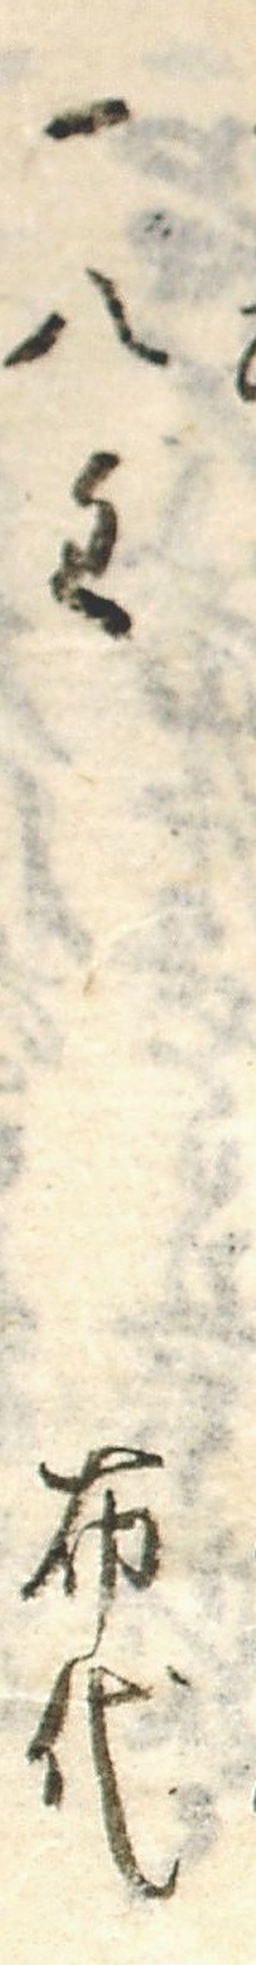一八匁布代
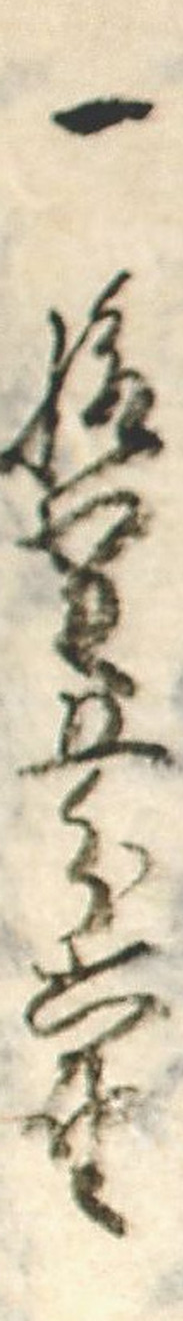九拾四匁五分弐厘
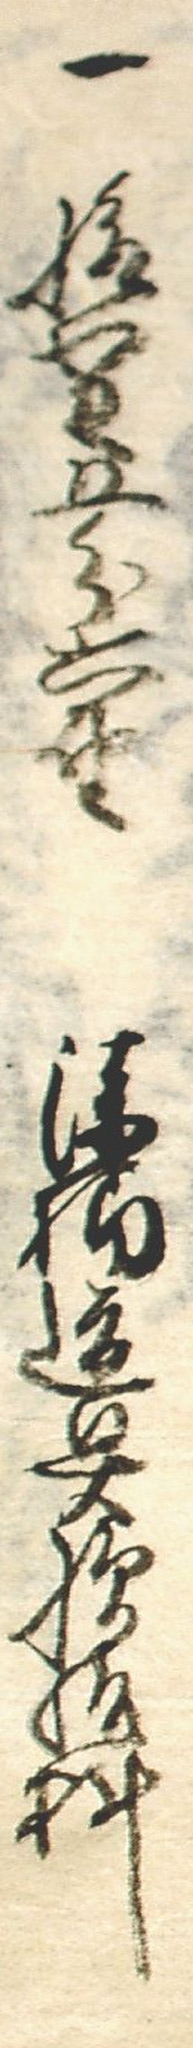一拾五匁五分六厘漆桶道具損給料
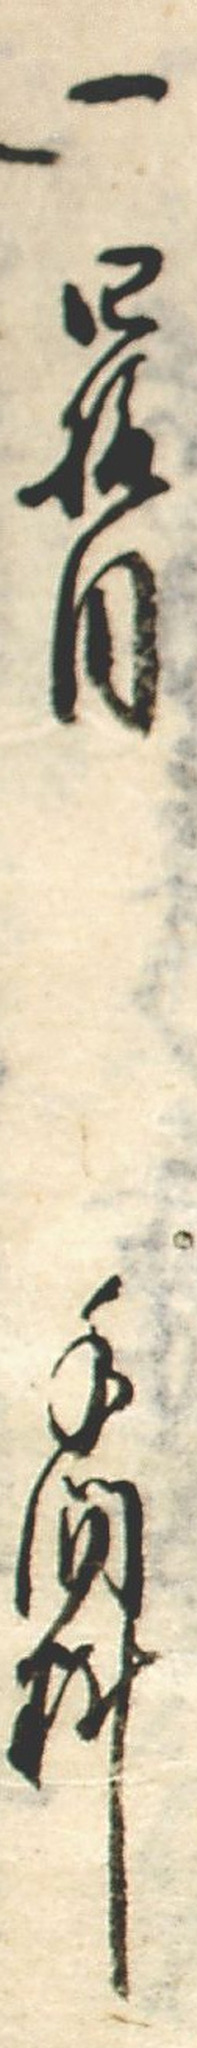一四拾目手間料
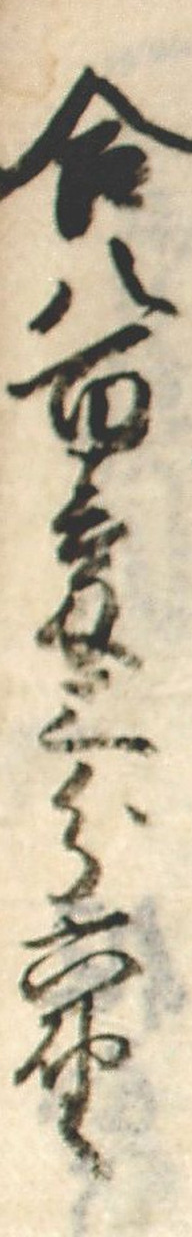合八百壱匁三分六厘
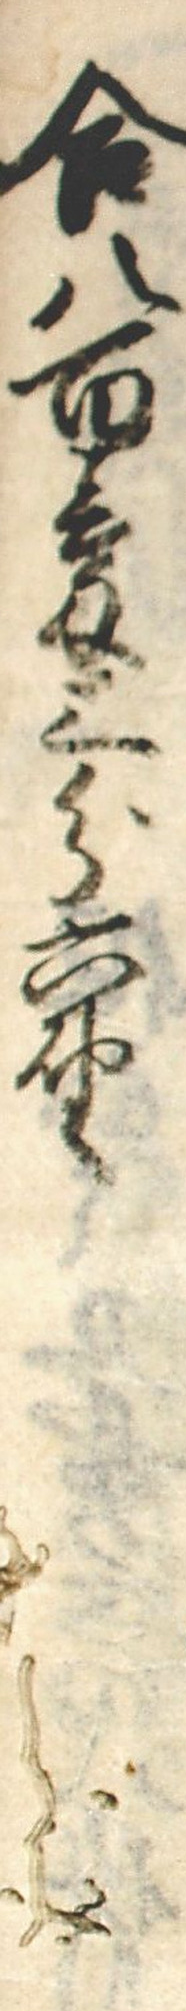合八百壱匁三分六厘

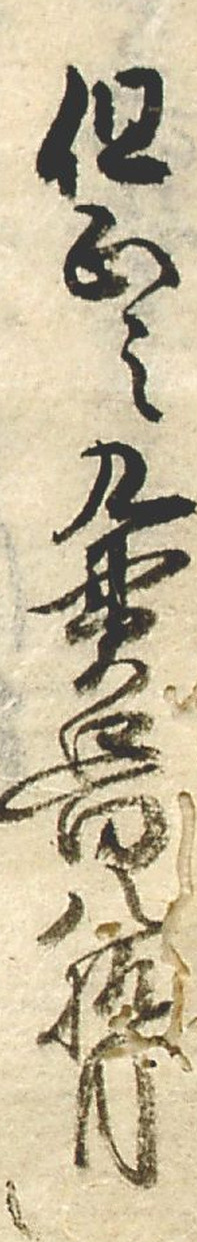但正ミ九貫四百八拾目
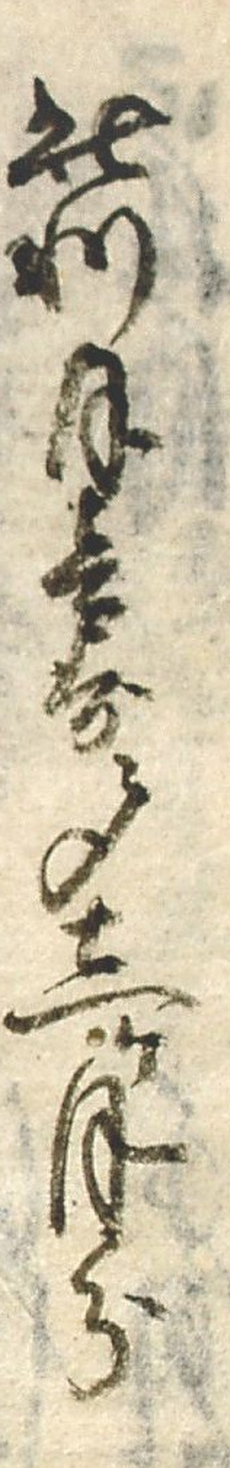此利月壱歩にして十二ケ月分
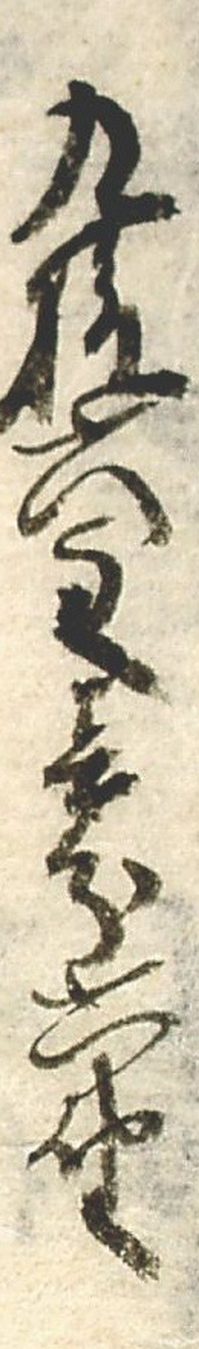九拾六匁壱分六厘
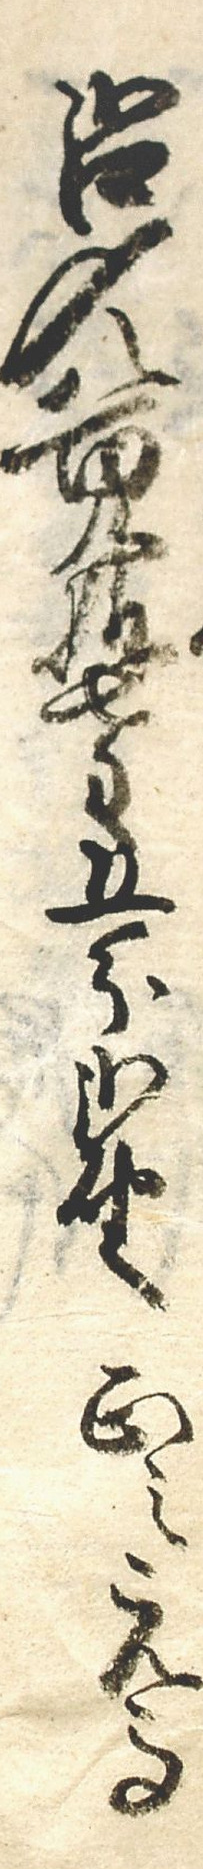弐口〆八百九拾七匁五分弐厘正ミ元高
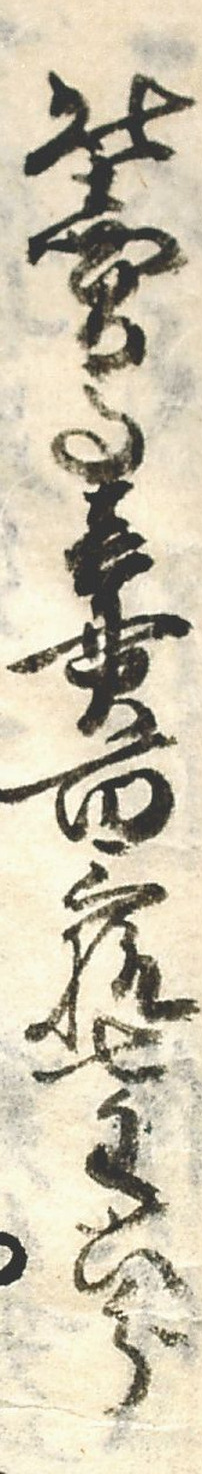此売高壱貫百三拾七匁六分
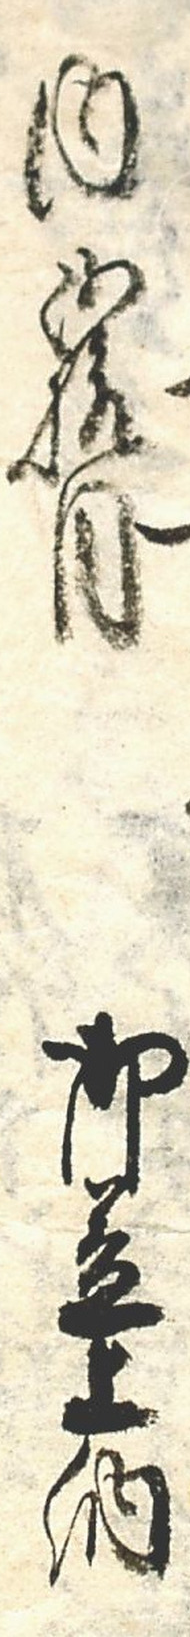内弐拾目御益上納
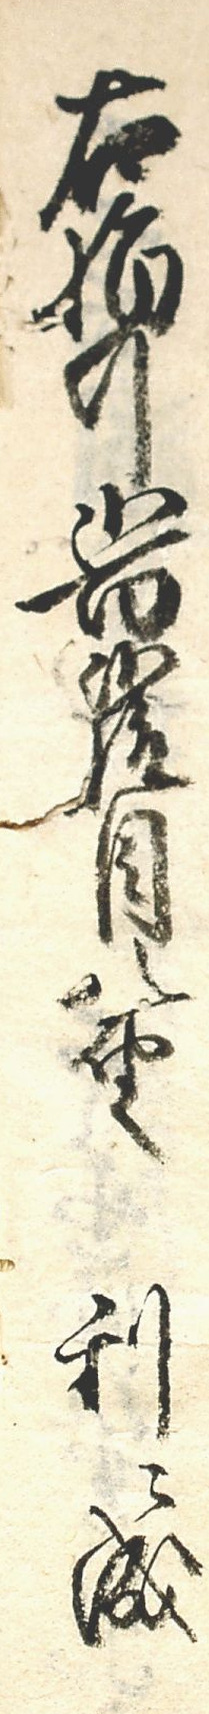右指引弐百弐拾目八厘利に成
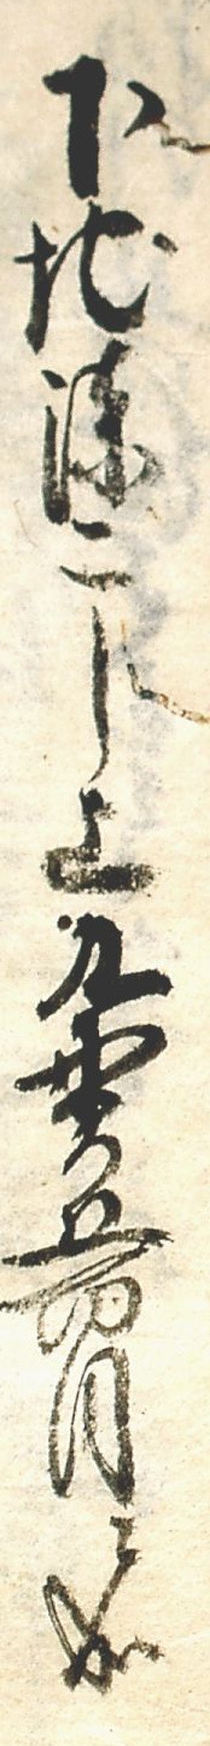下地漆こし上九貫五百目に成
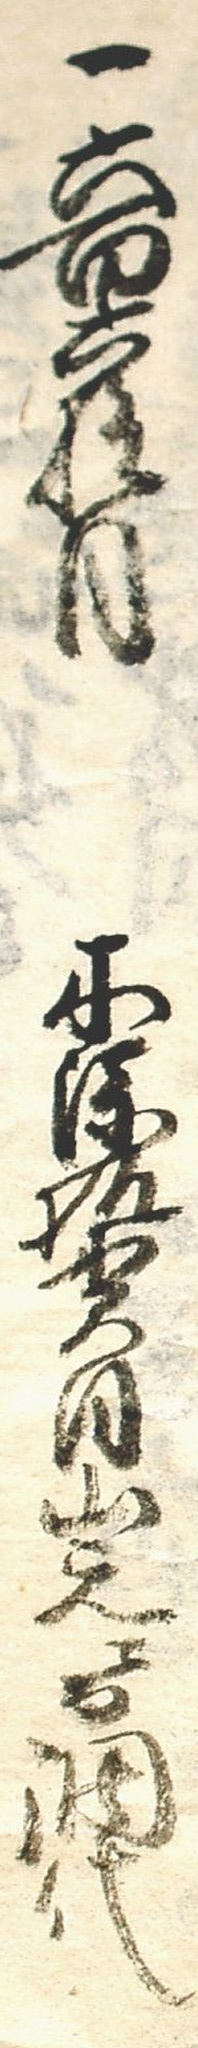一右六百六拾目木漆拾貫目山元に而調代
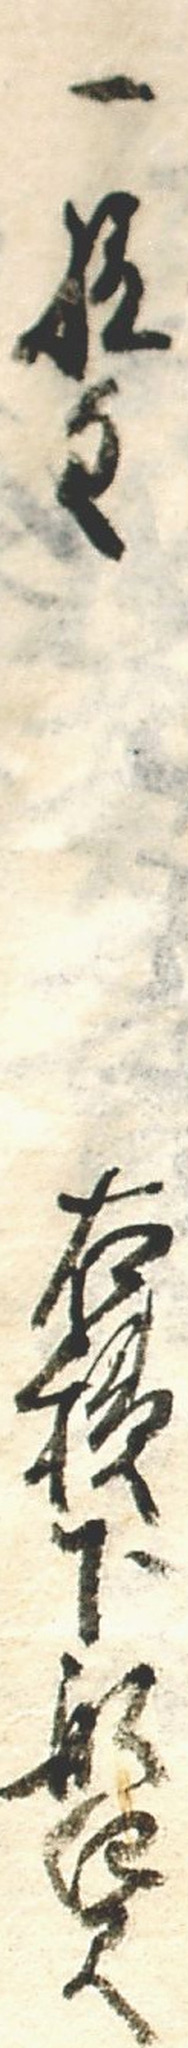一拾匁右積下船賃
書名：御国産漆製法越法算建書共取替速判帳
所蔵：鳴門教育大学 Naruto University of Education
